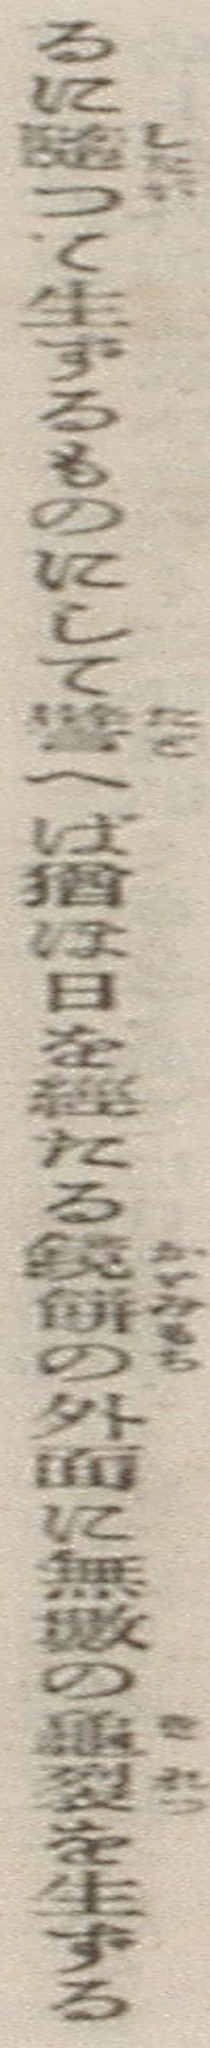るに随つて生ずるものにして譬えば猶ほ日を経たる鏡餅の外面に無数の亀裂を生ずる
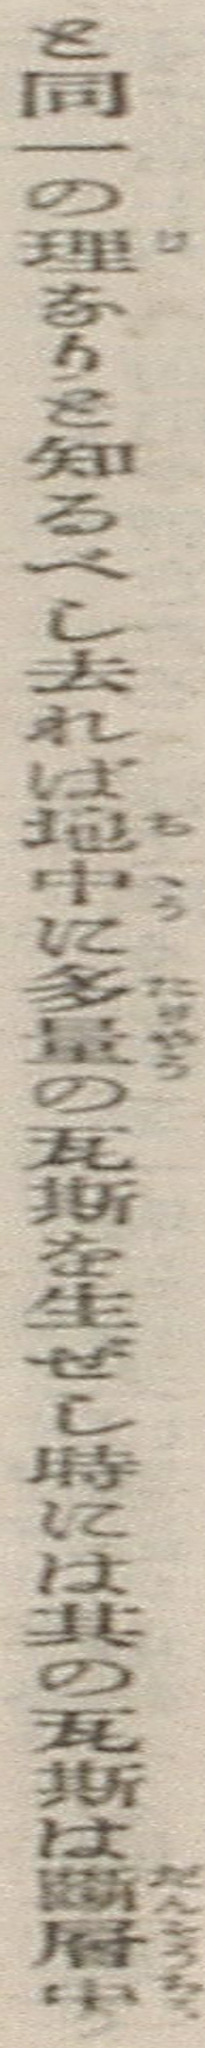と同一の理なりと知るべし去れば地中に多量の瓦斯を生ぜし時には其の瓦斯は断層中
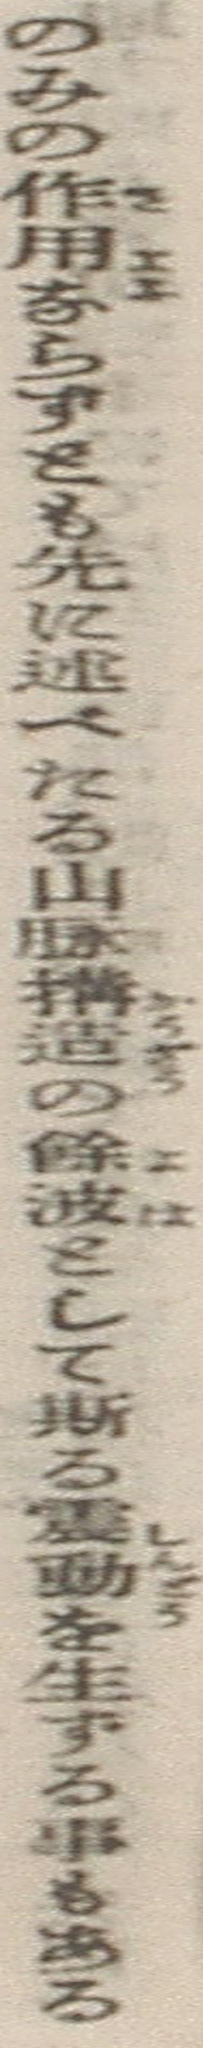のみの作用ならずとも先に述べたる山脈搆造の余波として斯る震動を生ずる事もある
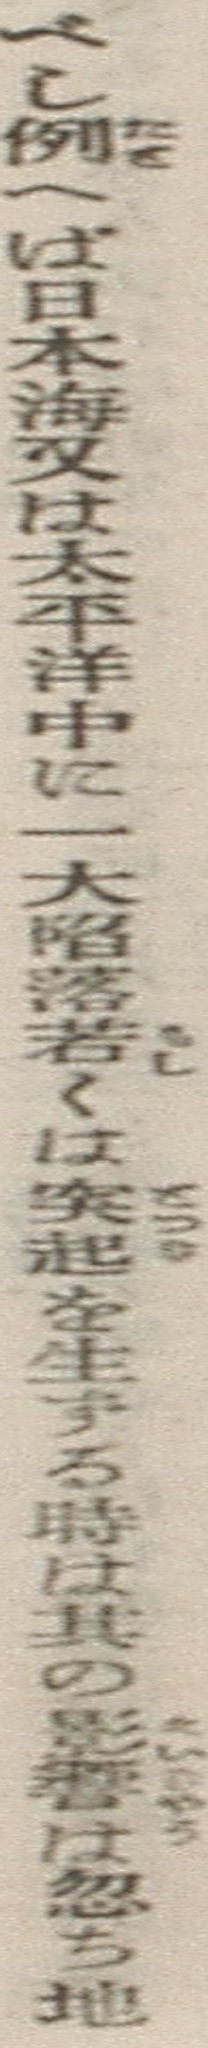べし例へば日本海又は太平洋中に一大陥落若くは突起を生ずる時は其の影響は忽ち地
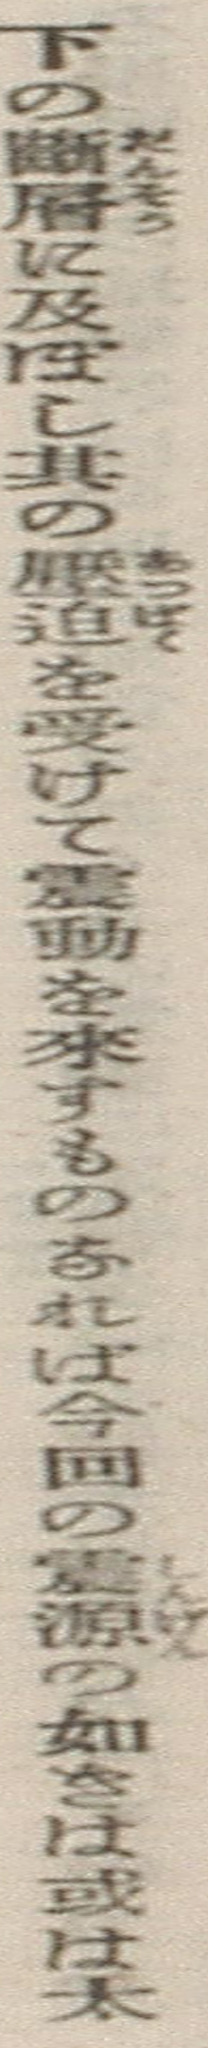下の断層に及ぼし其の圧迫を受けて震動を来すものなれば今回の震源の如きは或は太
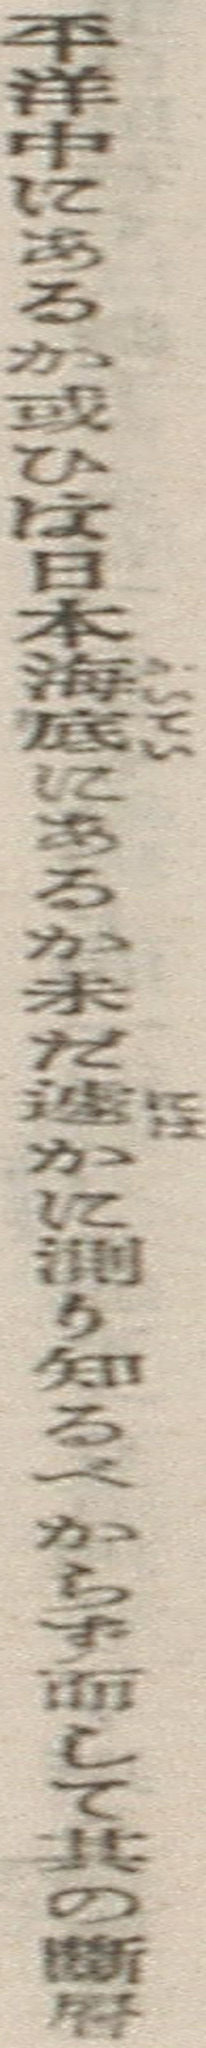平洋中にあるか或ひは日本海底にあるか未だ遽かに測り知るべからず而して其の断層
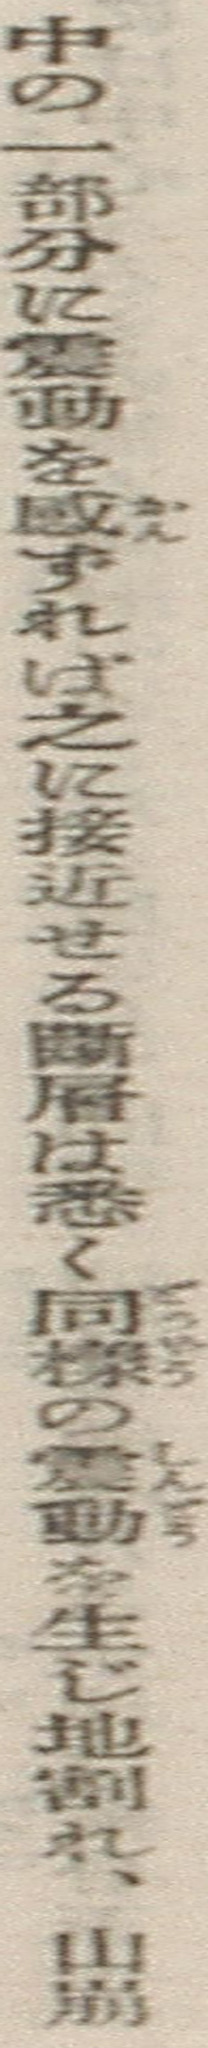中の一部分に震動を感ずれば之に接近せる断層は悉く同様の震動を生じ地割れ、山崩
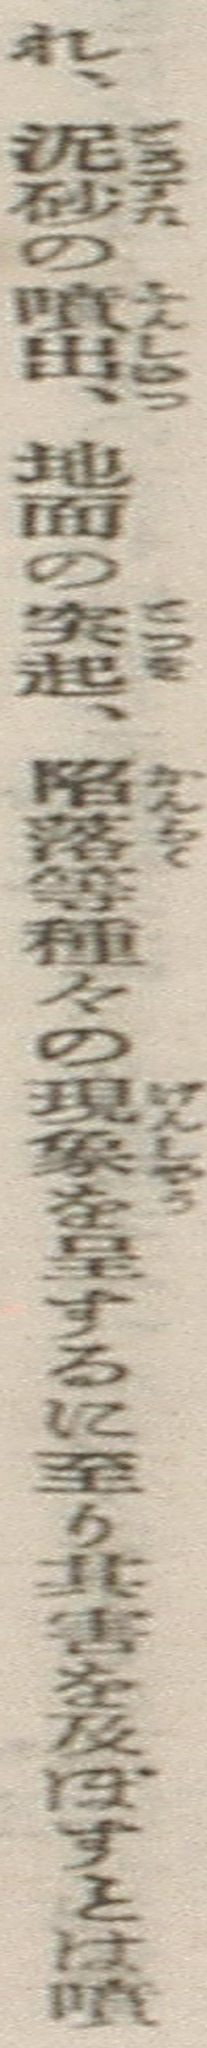れ、泥砂の噴出、地面の突起、陥落等種々の現象を呈するに至り其害を及ぼすことは噴
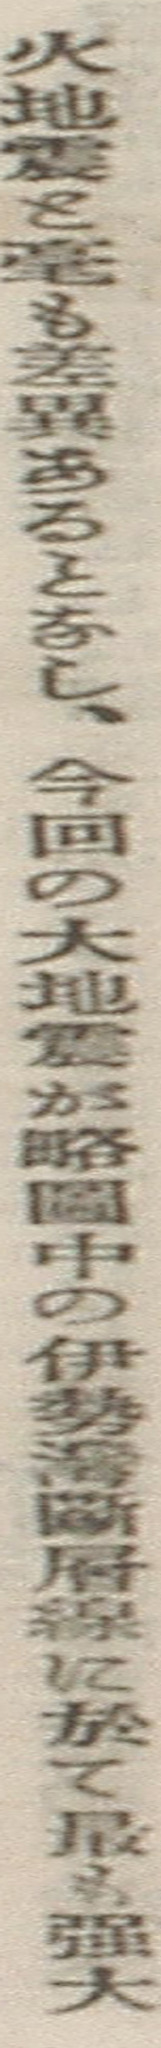火地震と毫も差異あることなし、今回の大地震が略図中の伊勢湾断層線に於て最も強大
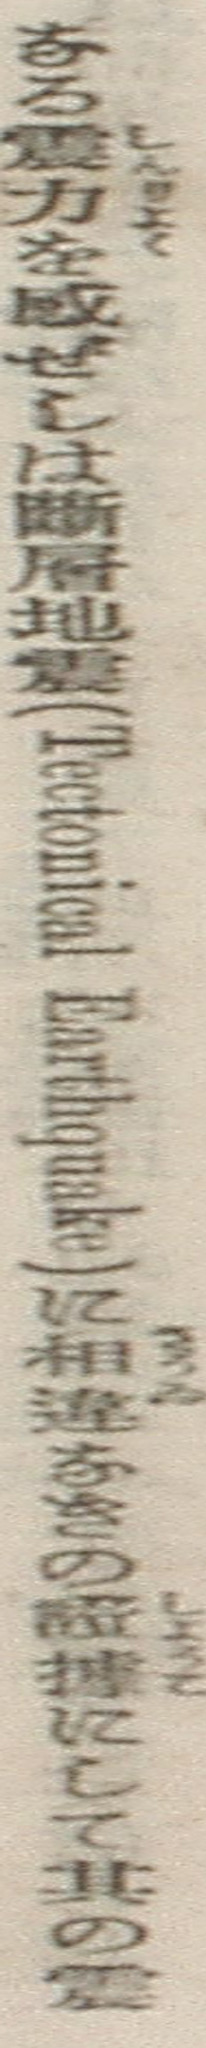なる震力を感ぜしは断層地震に相違なきの証拠にして其の震
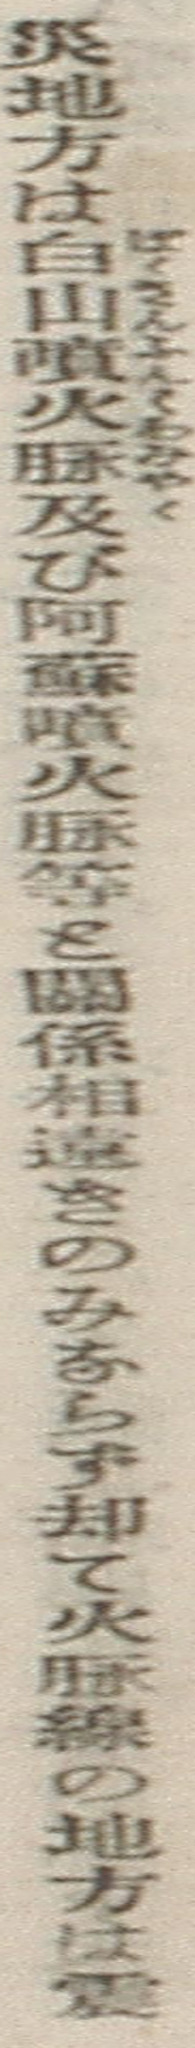災地方は白山噴火脈及び阿蘇噴火脈等と関係相遠きのみならず却て火脈線の地方は震
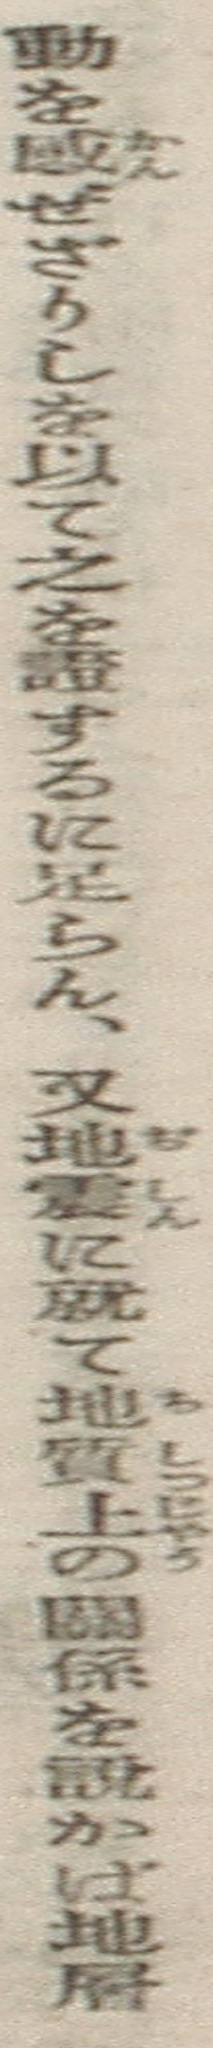動を感ぜざりしを以て之を証するに足らん、又地震に就て地質上の関係を説かば地層
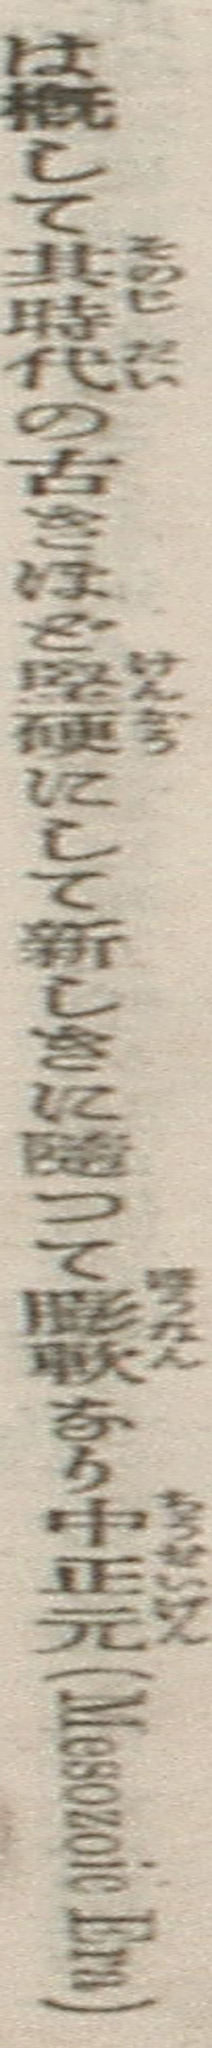は概して其時代の古きほど堅硬にして新しきに随つて膨軟なり中正元
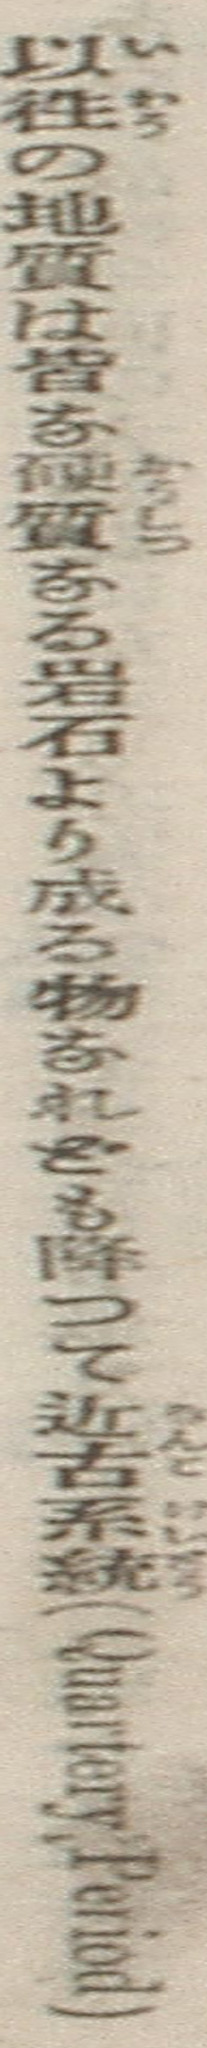以往の地質は皆な硬質なる岩石より成る物なれども降つて近古系統
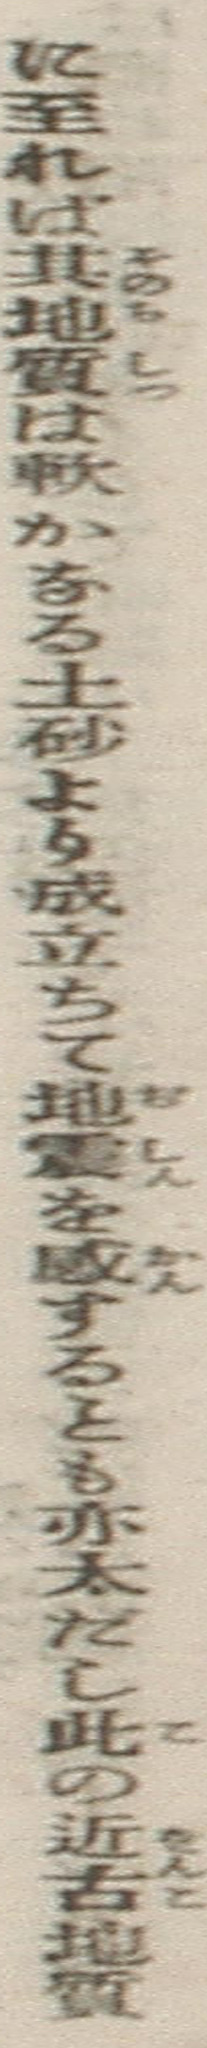に至れば其地質は軟かなる土砂より成立ちて地震を感ずるとも亦太だし此の近古地質

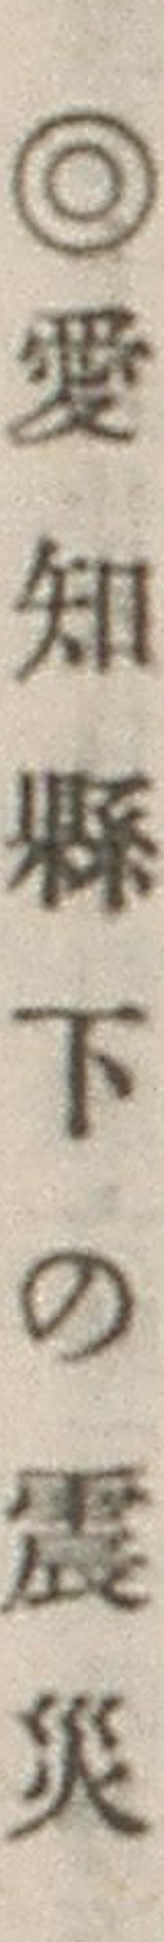◎愛知県下の震災
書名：愛知岐阜福井三県　大地震見聞録（内題）
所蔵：東京大学地震研究所図書室 Earthquake Research Institute Library, The University of Tokyo, JAPAN
